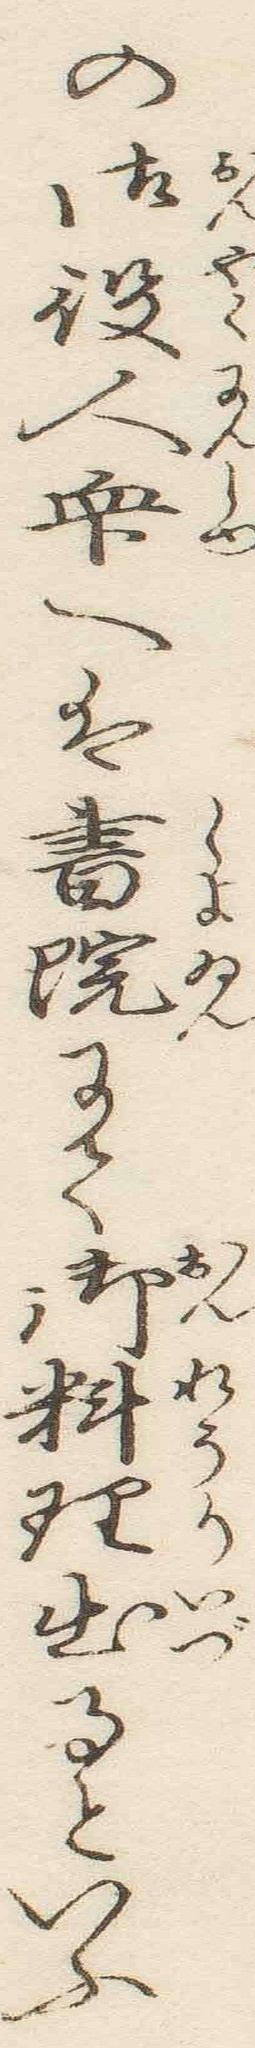の御役人衆へは書院にて御料理出るといふ

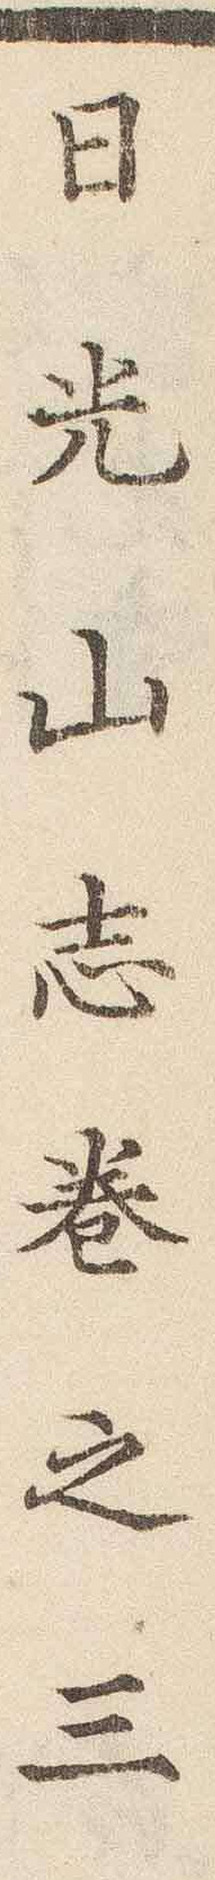日光山志巻之三

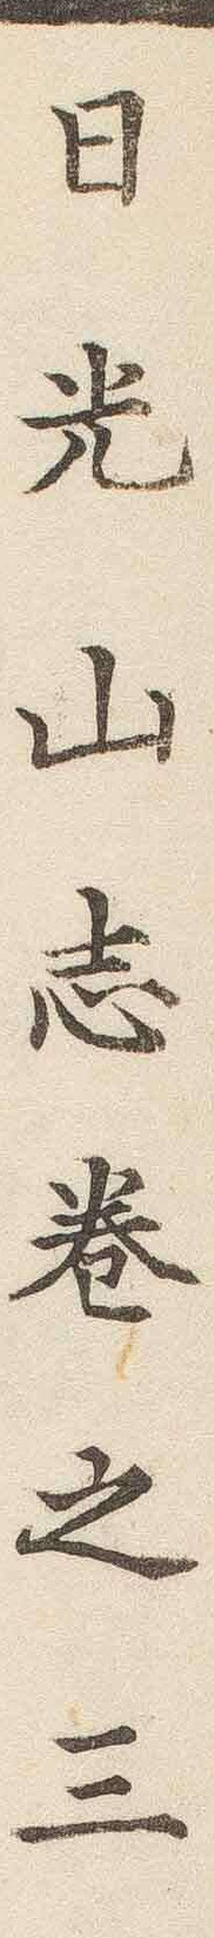日光山志巻之三
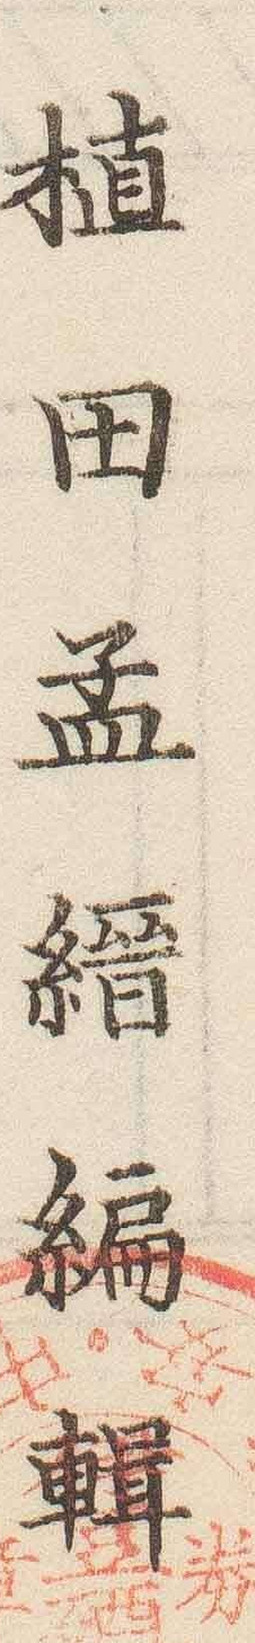植田孟縉編輯
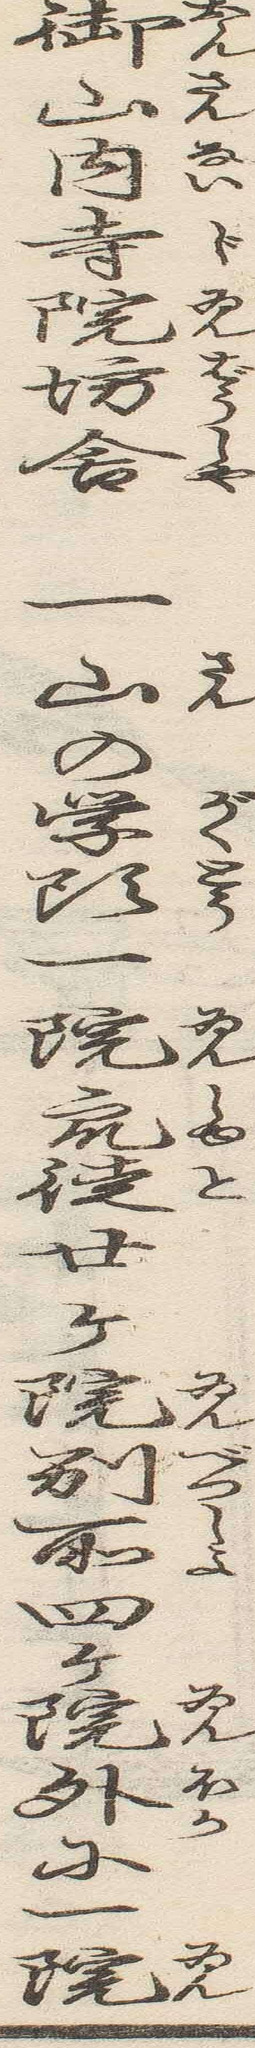御山内寺院坊舍一山の学頭一院衆徒廿ヶ院別所四ヶ院外に一院
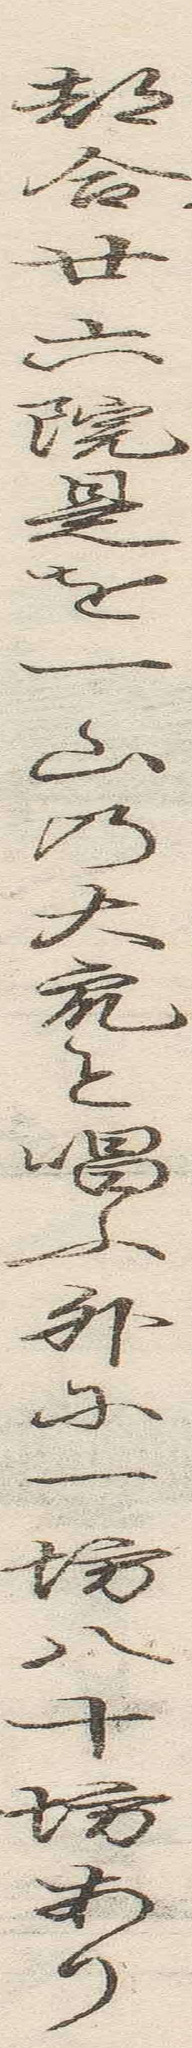都合廿六院是を一山の大衆と唱ふ外に一坊八十坊あり
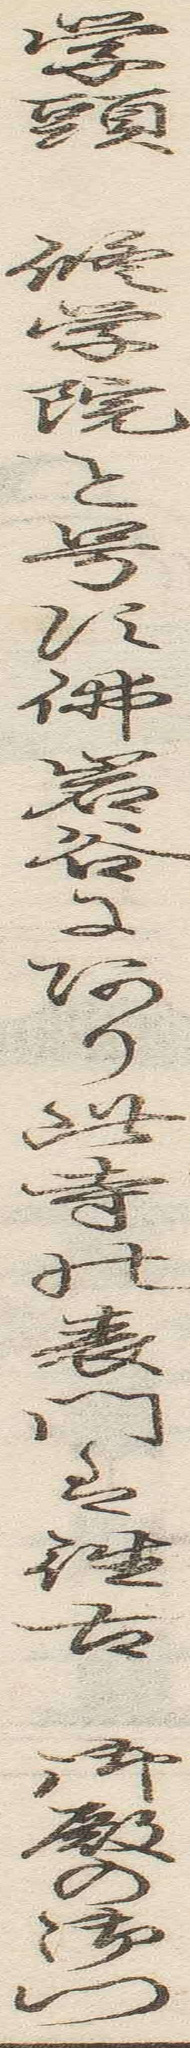学頭修学院と号す佛岩谷あり此寺の表門は徃古御殿の御門
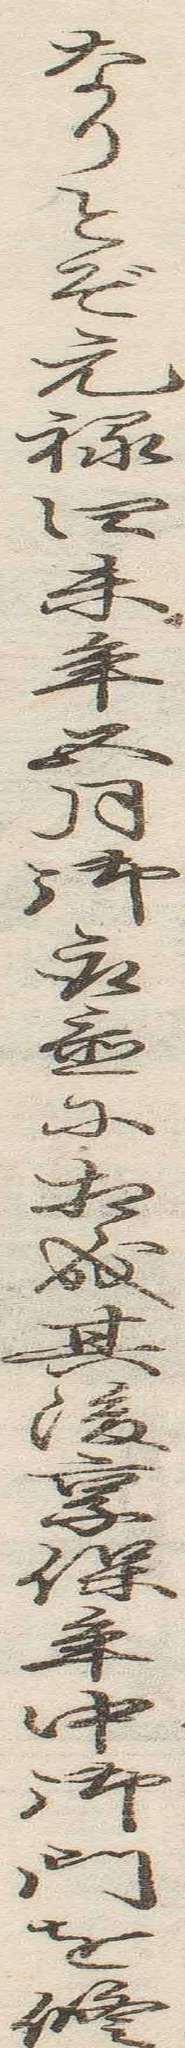なりとぞ元禄四未年五月御取置に相成其後享保年中御門を修
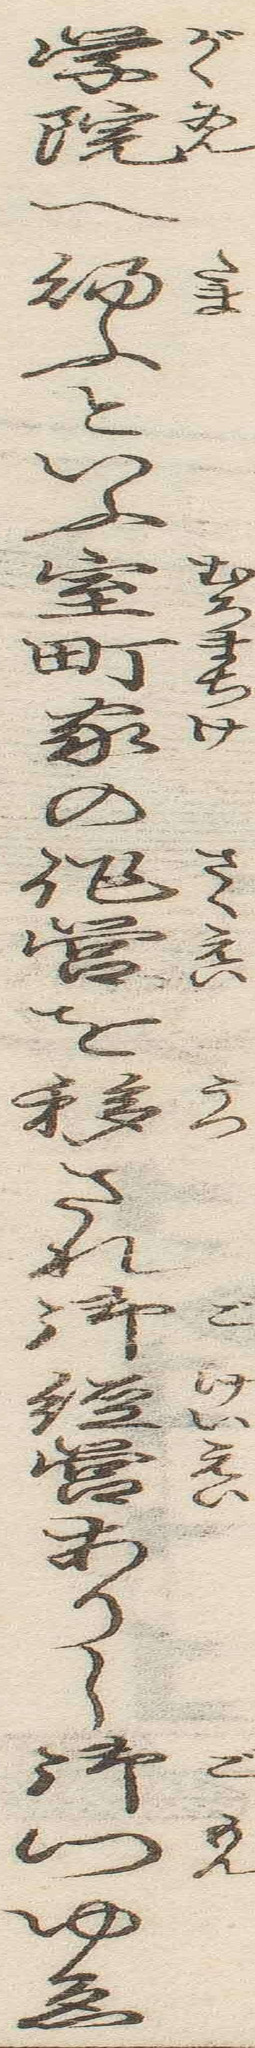学院へ賜ふといふ室町家の作営を移され御經営ありし御門ゆゑ
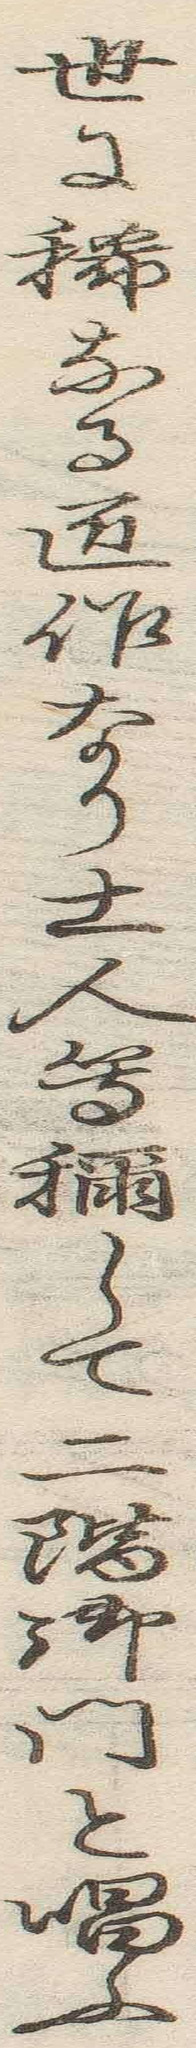世に稀なる匠作なり土人等穪して二階御門と唱ふ
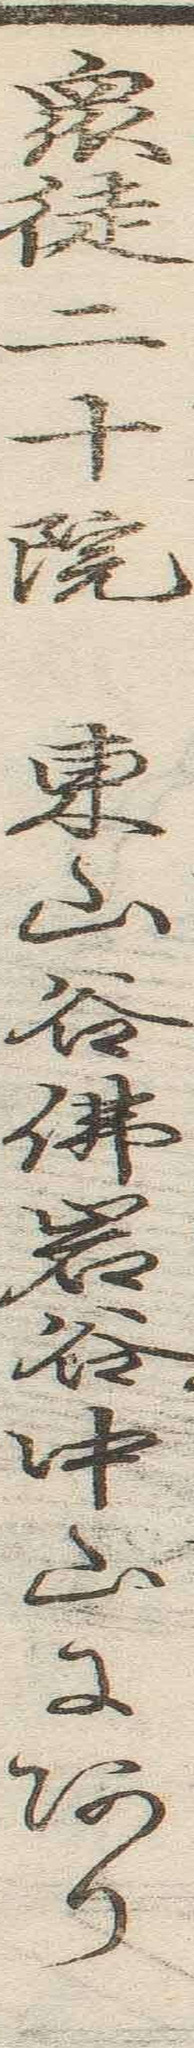衆徒二十院東山谷佛岩谷中山にあり

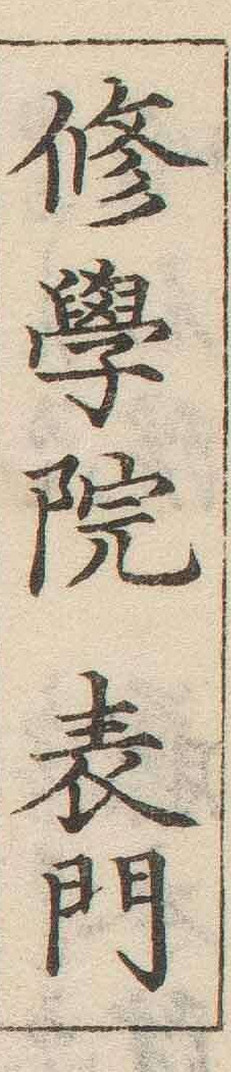修學院表門
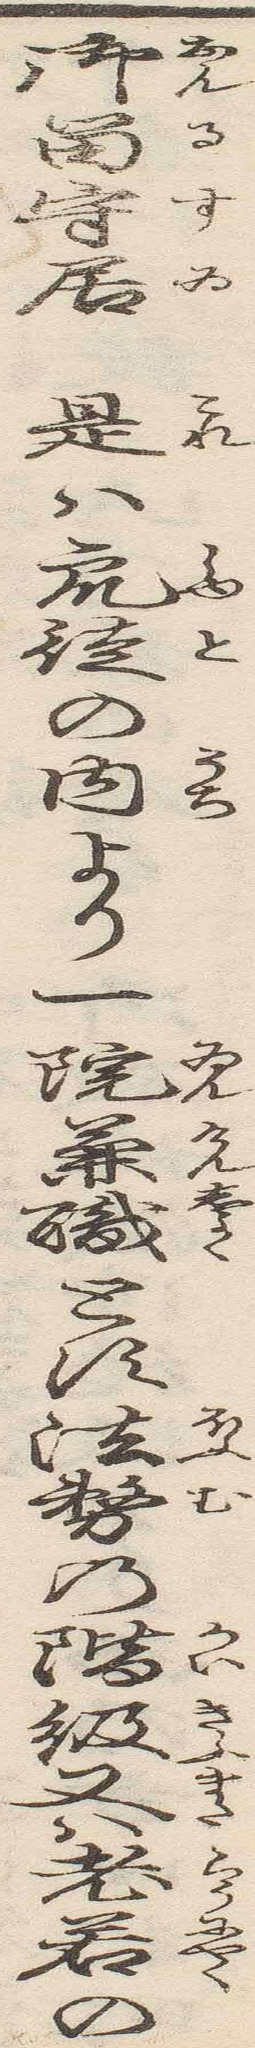御畄守居是は衆徒の内より一院兼職とす法務の階級又は老若の
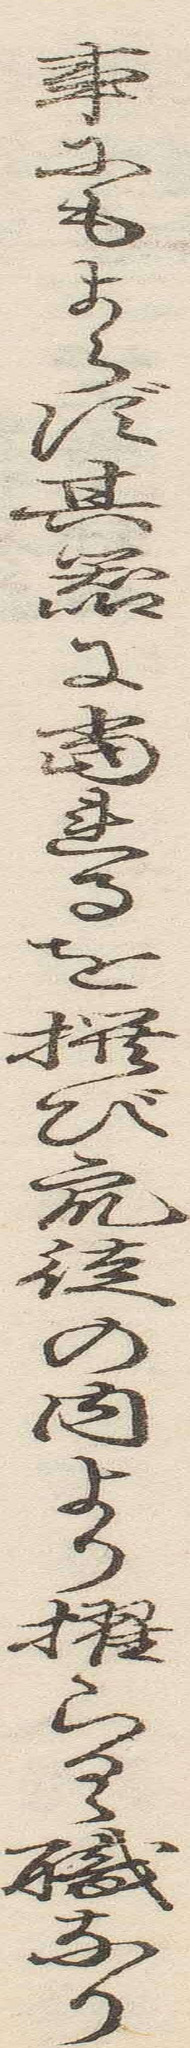事にもよらず其器に當れるを撰び衆徒の内より擢らるゝ職なり
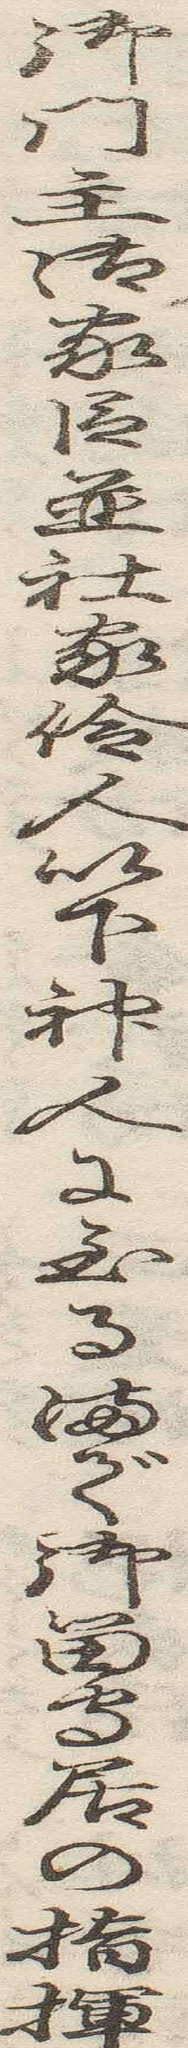御門主御家臣並社家伶人以下神人に至まで御畄守居の指揮
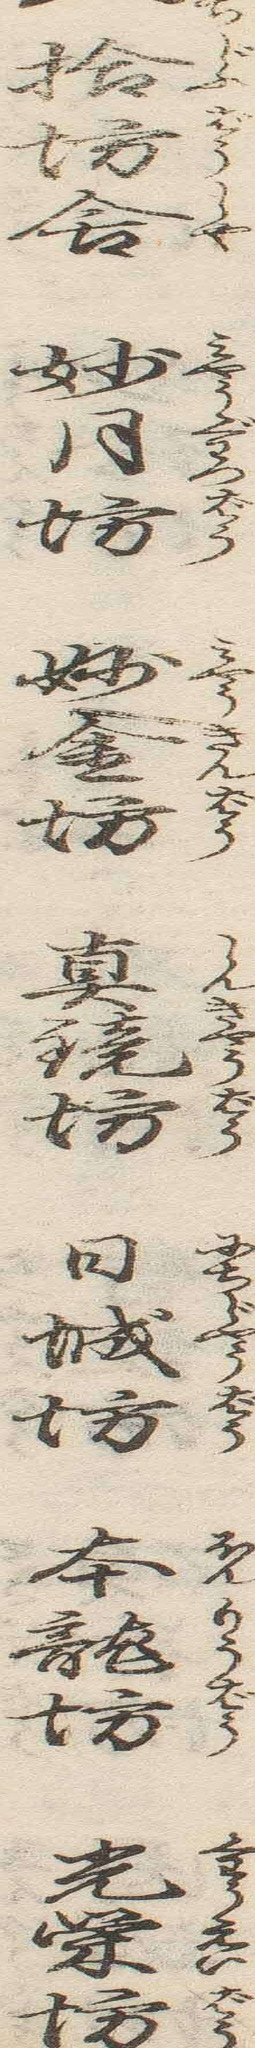八拾坊舍妙月坊妙金坊真鏡坊日城坊本龍坊光栄坊
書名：日光山志
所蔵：東京学芸大学附属図書館 国文学研究資料館
